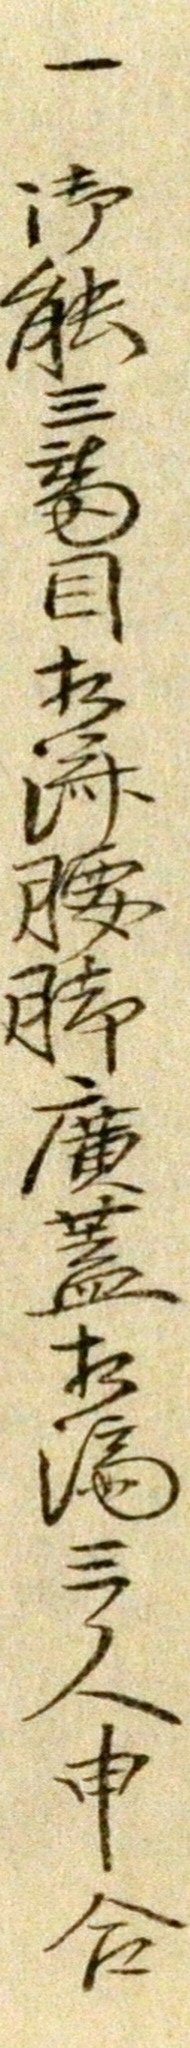一御能三番目相済腰脚廣蓋相済三人申合
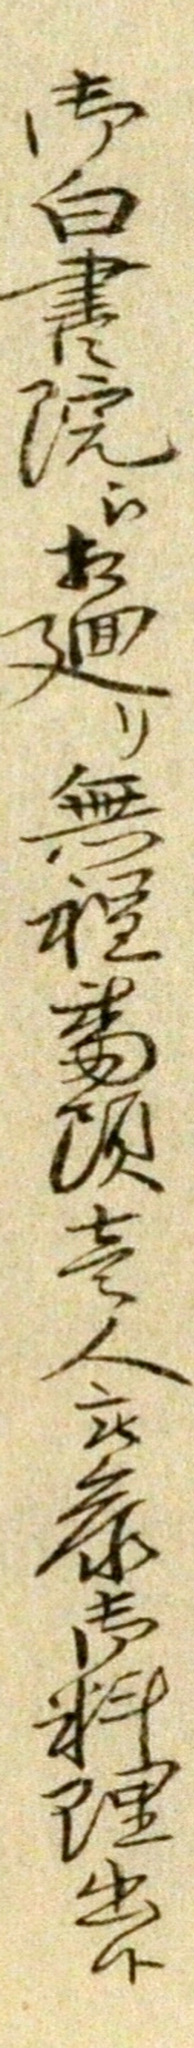御白書院え相廻り無程番頭壱人被参御料理出候
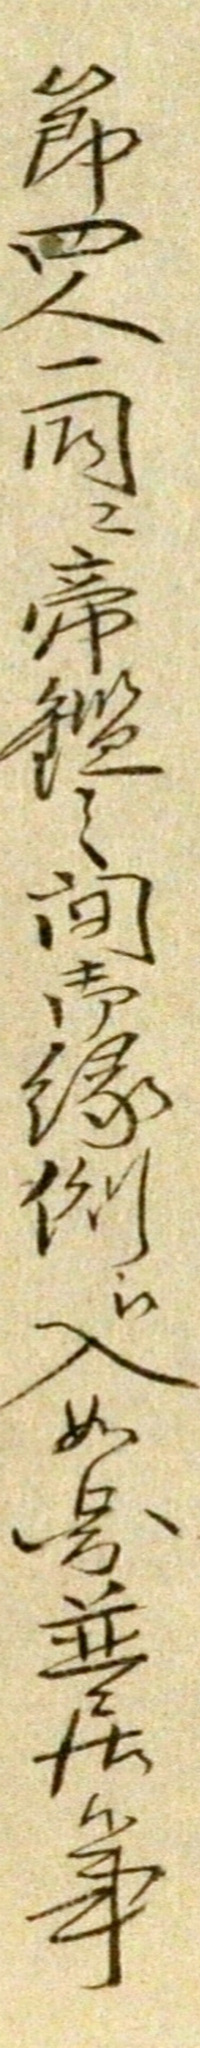節四人一同ニ帝鑑之間御縁側え入如圖並居候事
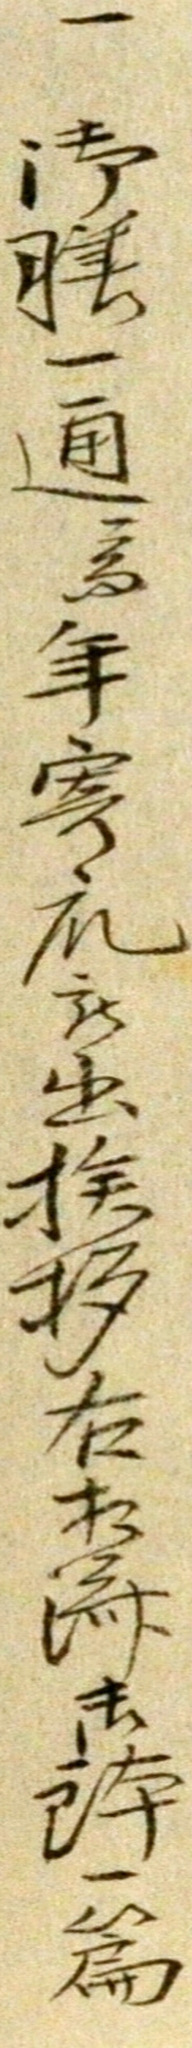一御膳一通ニ而年寄衆罷被出挨拶右相済御鉢一篇
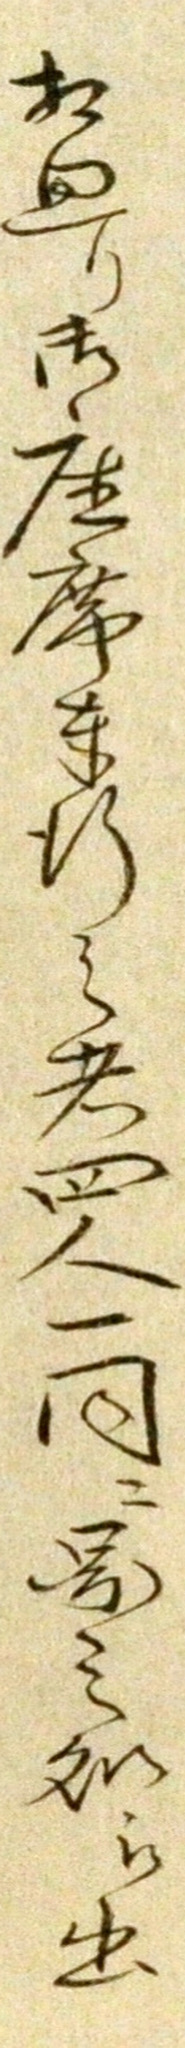相廻り御座席奉行之者四人一同ニ圖之処え出
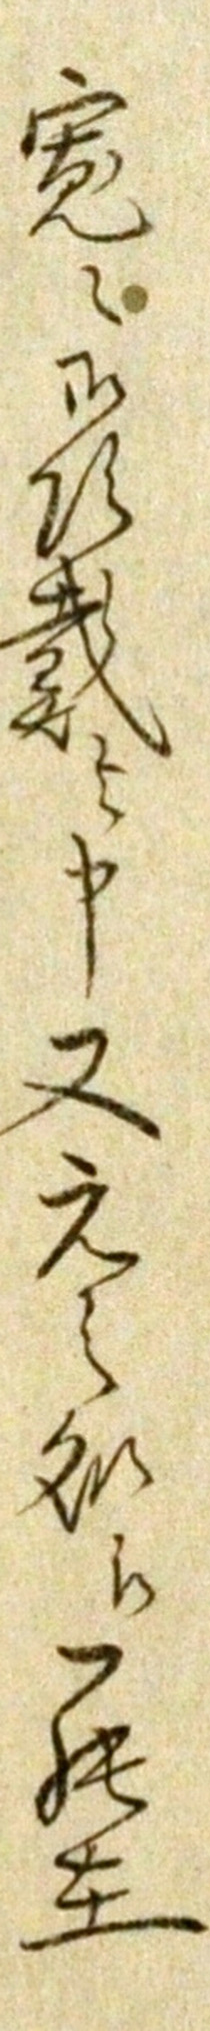寛々御頂戴と申又元之処え罷在
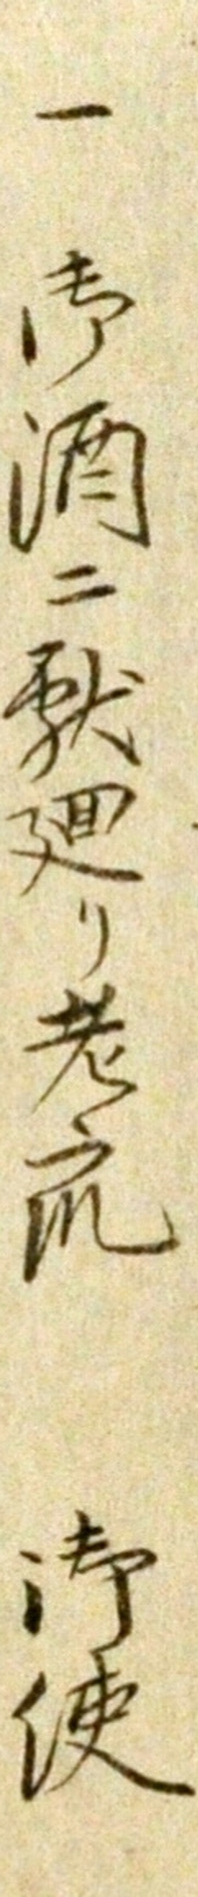一御酒二献廻り老衆御使
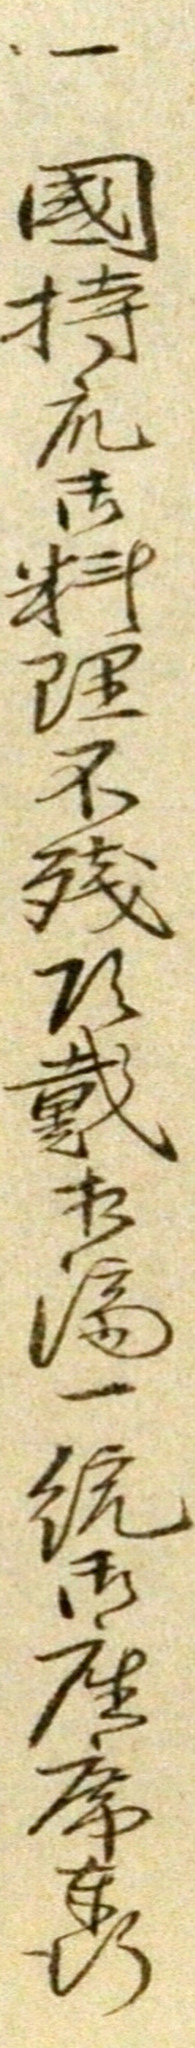一國持衆御料理不残頂戴相済一統御座席奉行
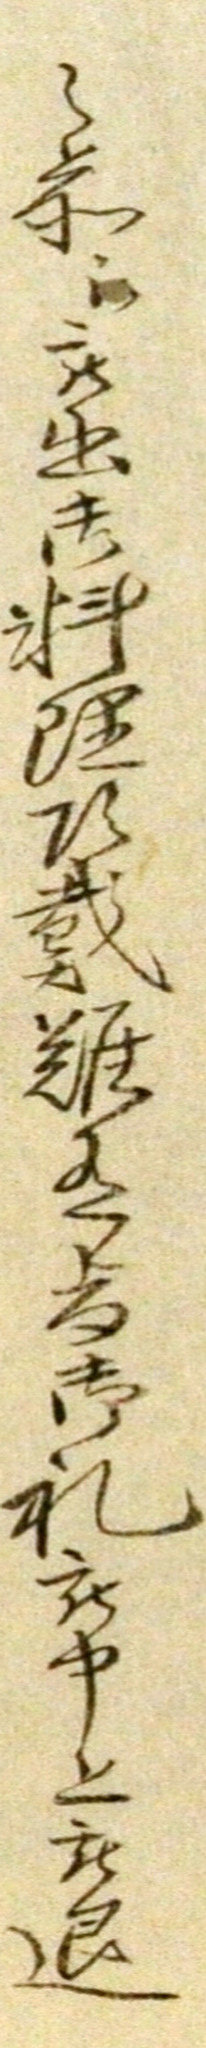之前え罷被出御料理頂戴難有旨御礼被申上被退
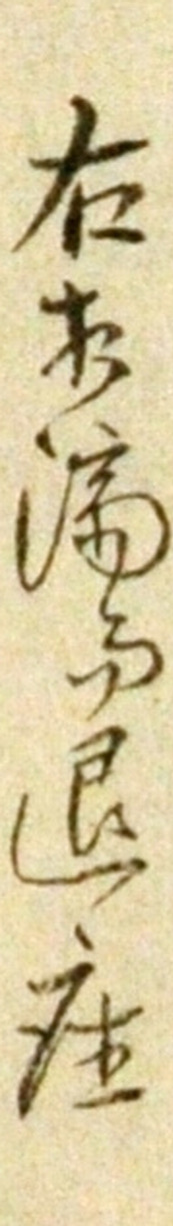右相済而退座

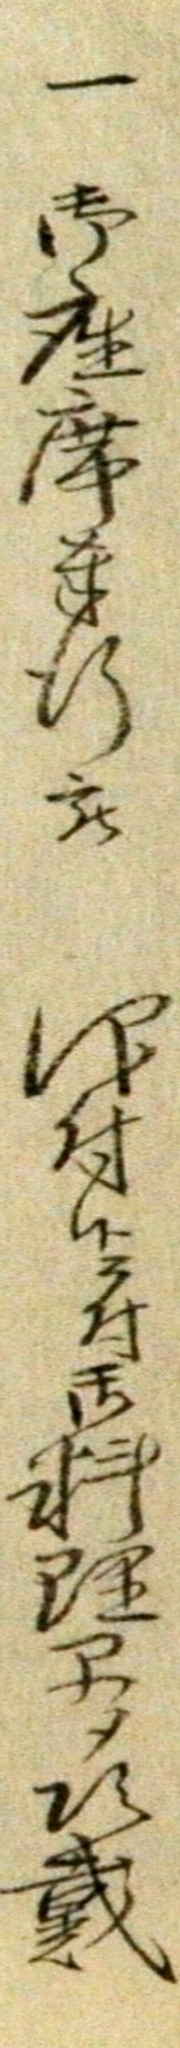一御座席奉行被仰付候ニ付御料理早メ頂戴
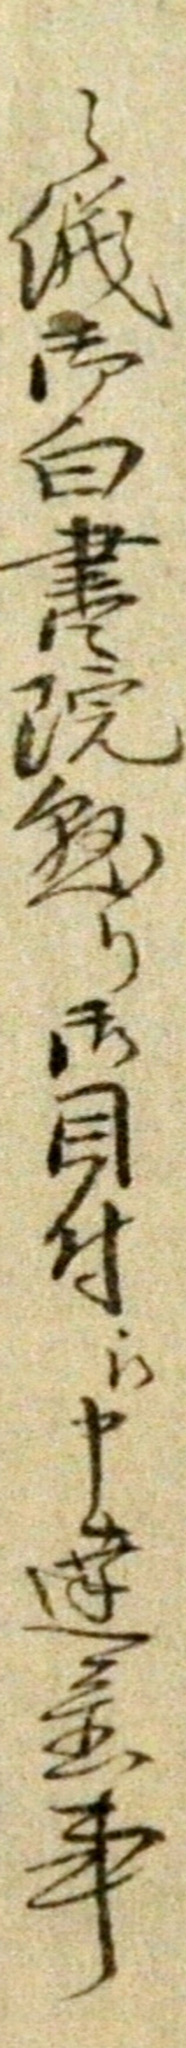之儀御白書院懸り御目付え申達置事
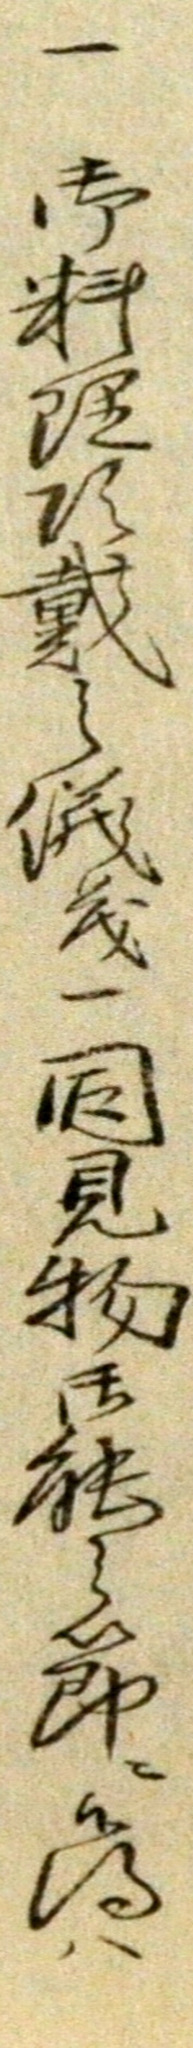一御料理頂戴之儀も一同見物御能之節ニ候得ハ
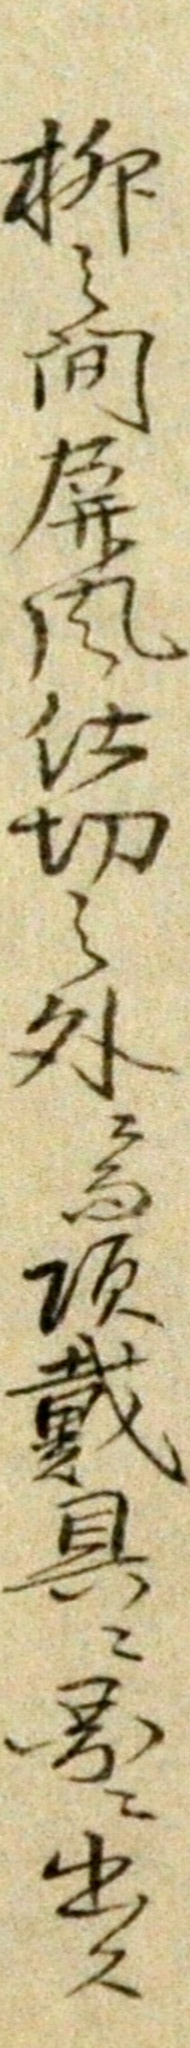栁之間屏風仕切之外ニ而頂戴具ニ圖ニ出ス
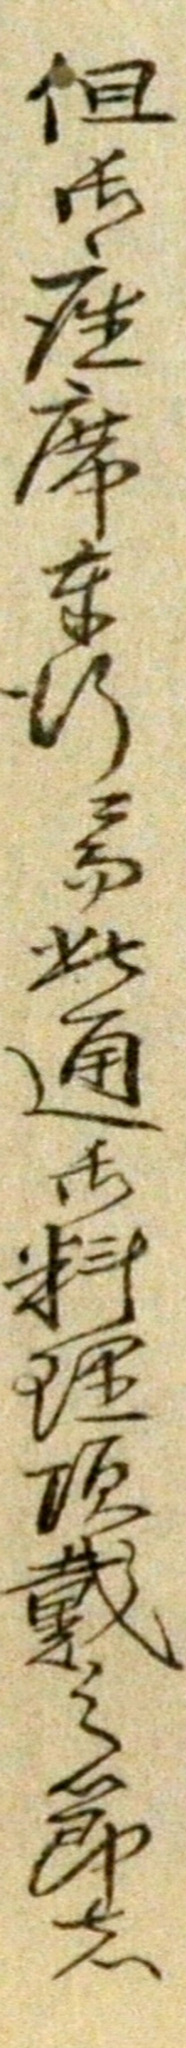但御座席奉行ニ而此通御料理頂戴之節は
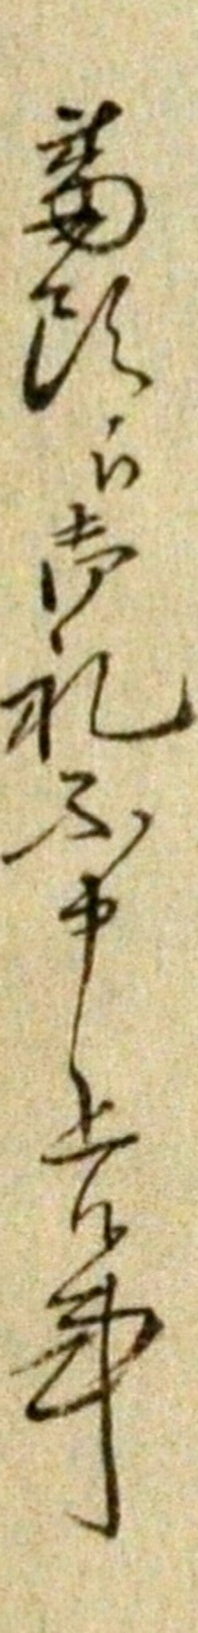番頭え御礼不申上候事
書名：御白書院御座席奉行勤方留外
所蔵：伊那市立高遠町図書館・合同会社AMANE
